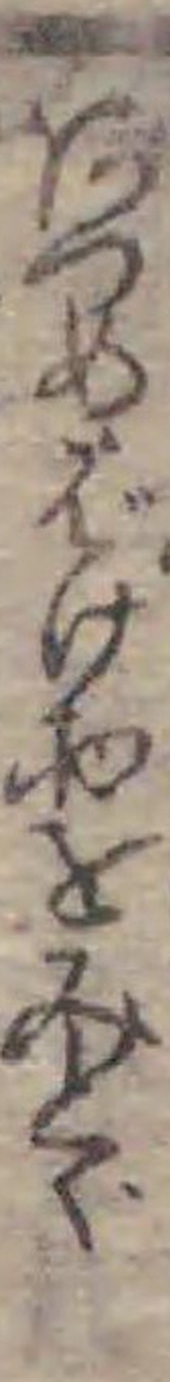あつめばけ物をみとゞ
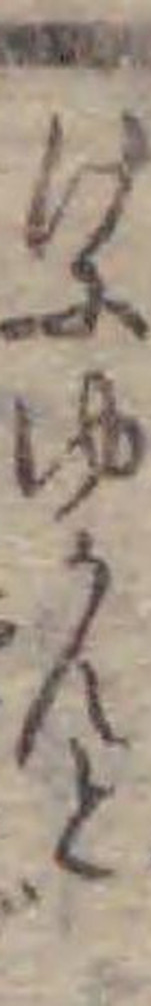けにゆかんと
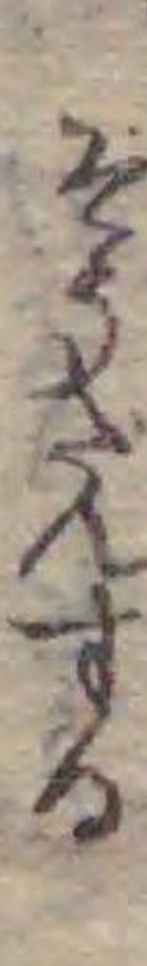そうだんする
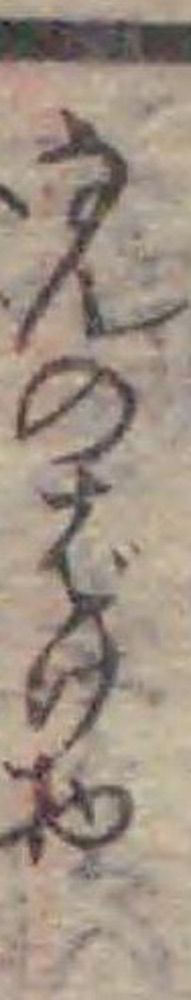なんのばけ物
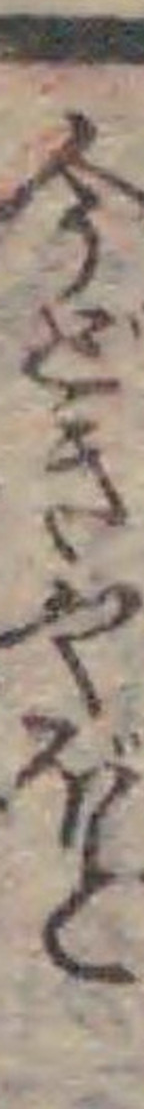今どきやぼと
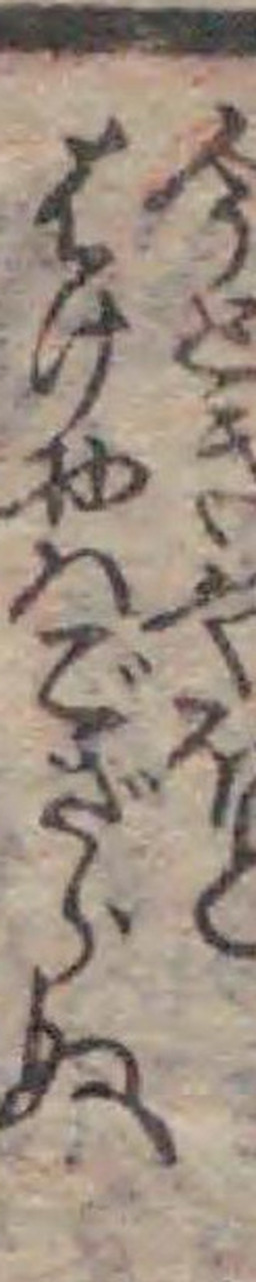はけ物はござらぬ
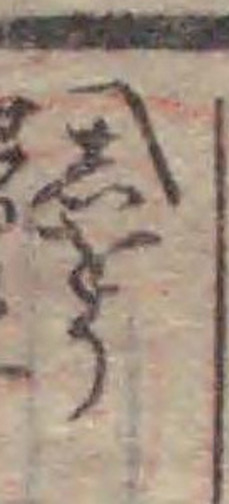〽しをう
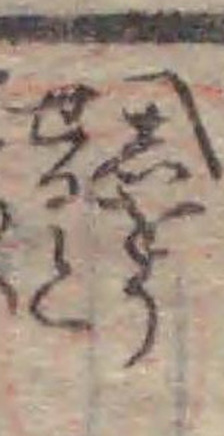〽しをう
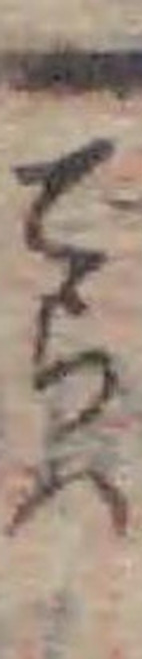てらは
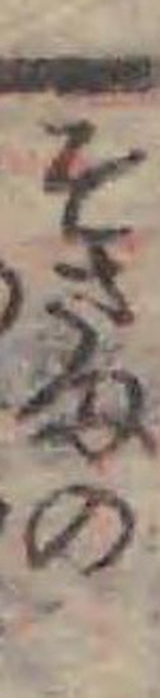そさまの
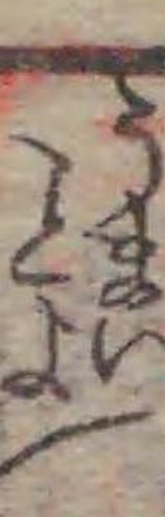うまい
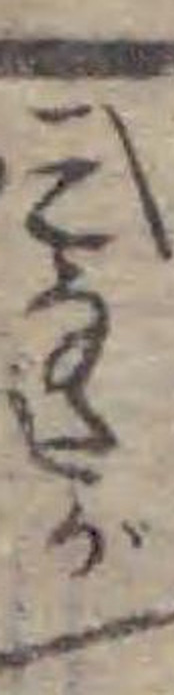〽こなたが
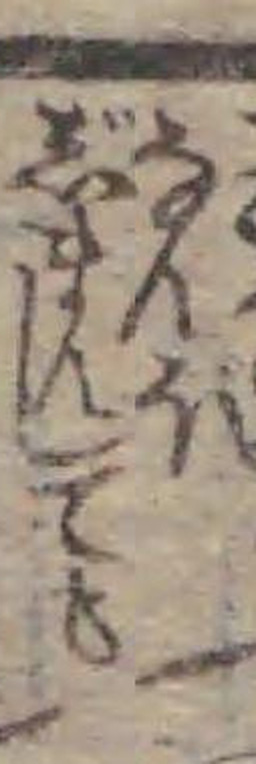じまんしても
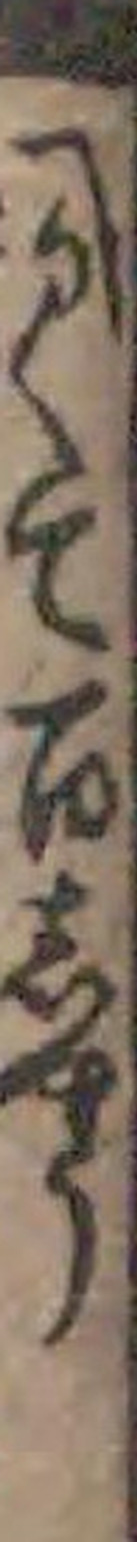〽かくて百しやう
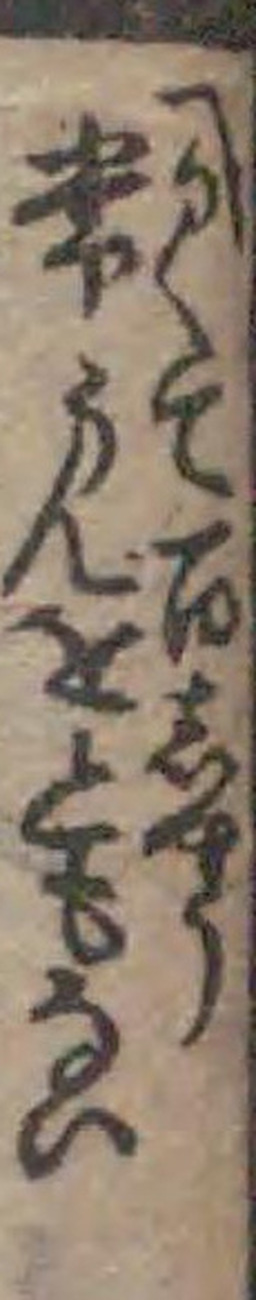常うんをともない
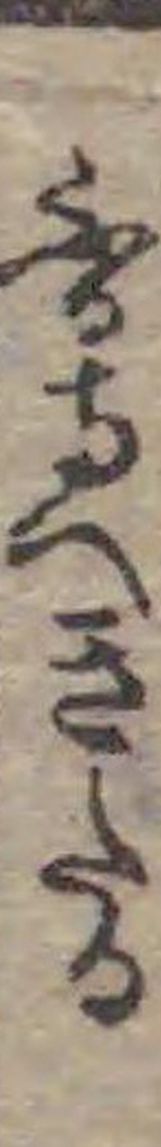ふる寺へきたる
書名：歌の化物一寺再興 : 2巻
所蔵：国立国会図書館 National Diet Library, JAPAN
